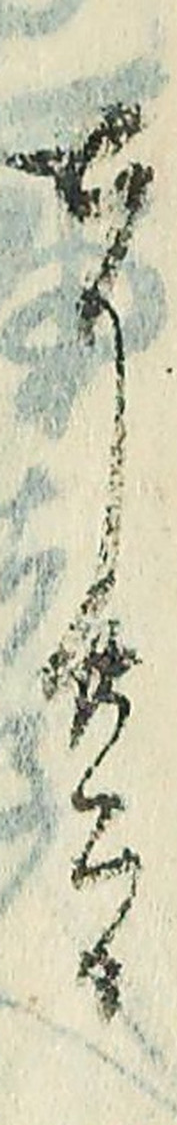七月廿二日
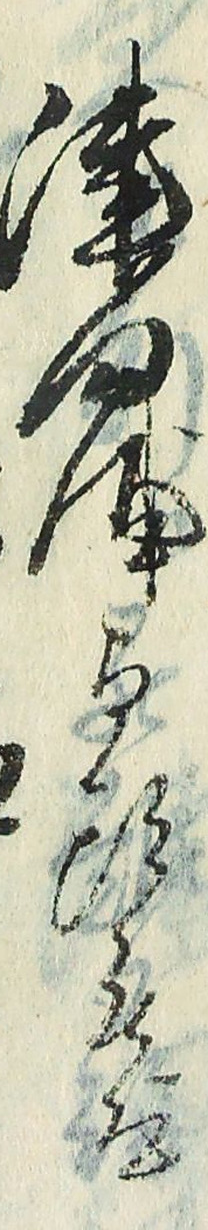津田浦与頭庄屋
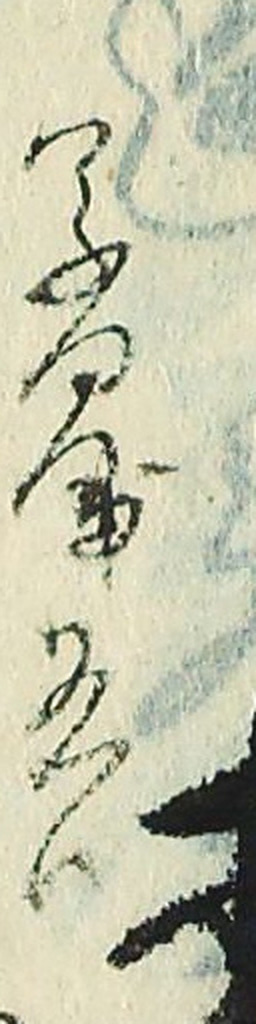冨田浦右同
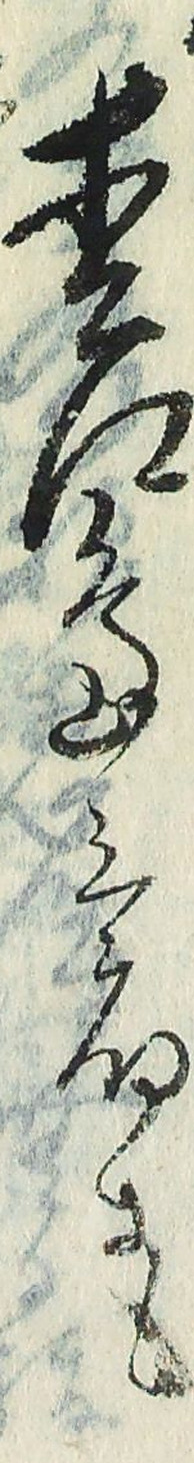松江島三郎方へ
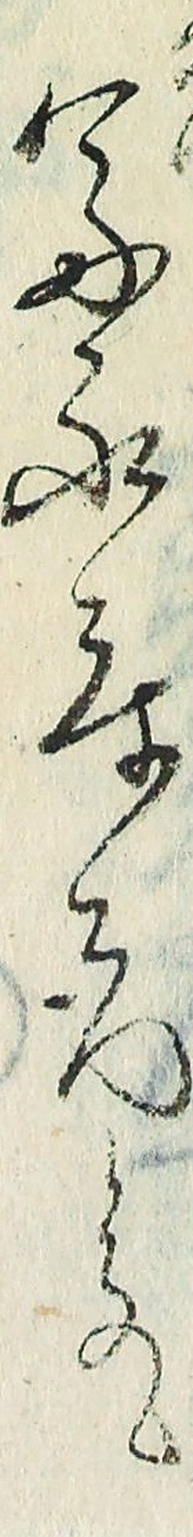富永茂右衛門方へ
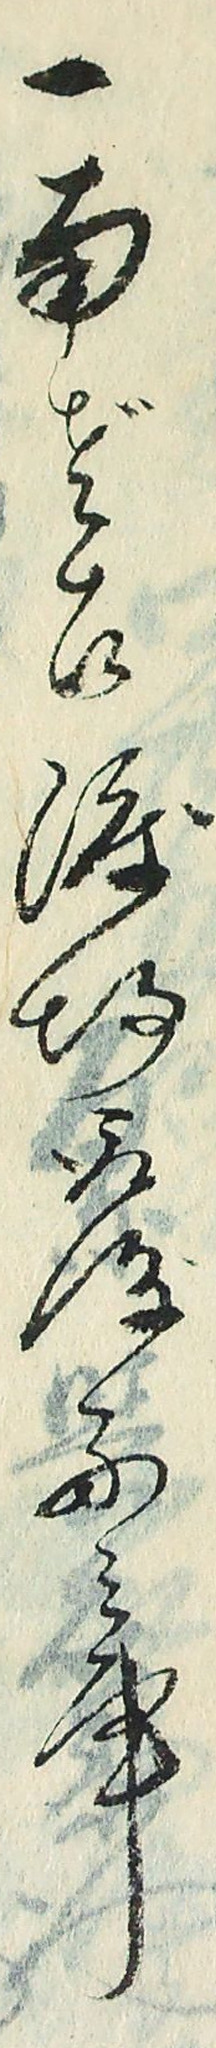一南ざ古渡場取渡舟之事
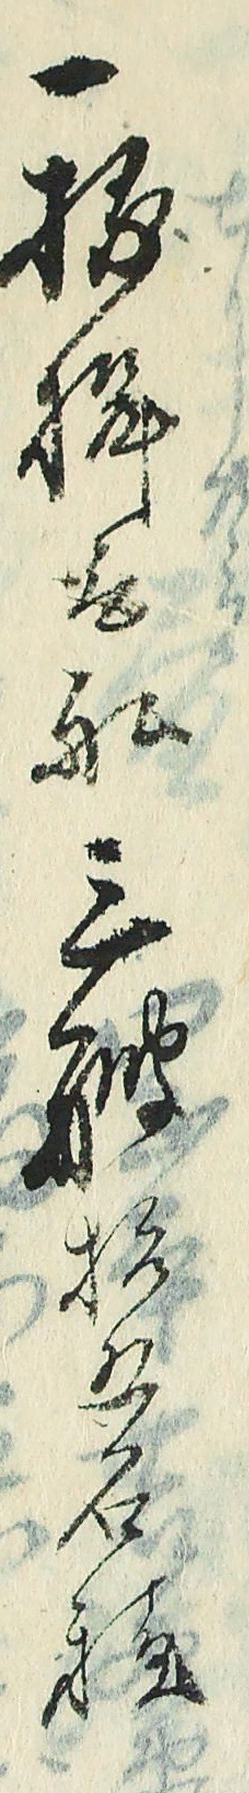一持楫取船三艘拾五石積
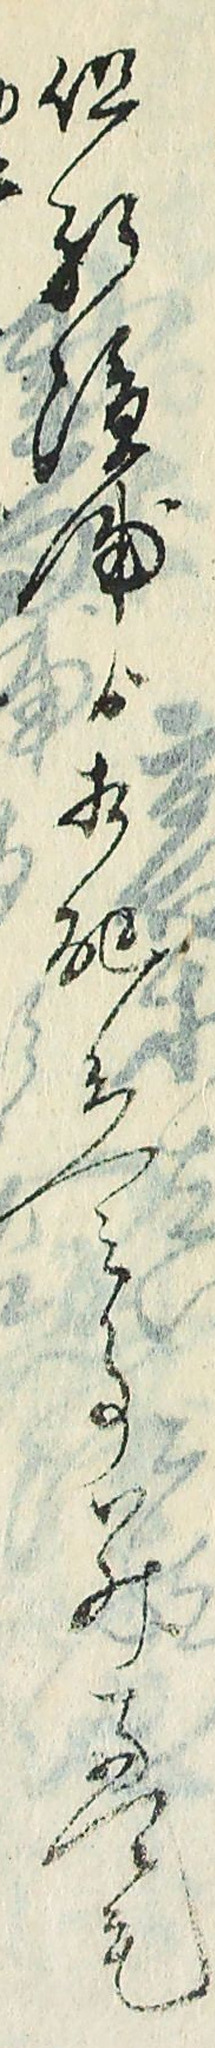但新浜浦ゟ相配有之事美畳毛
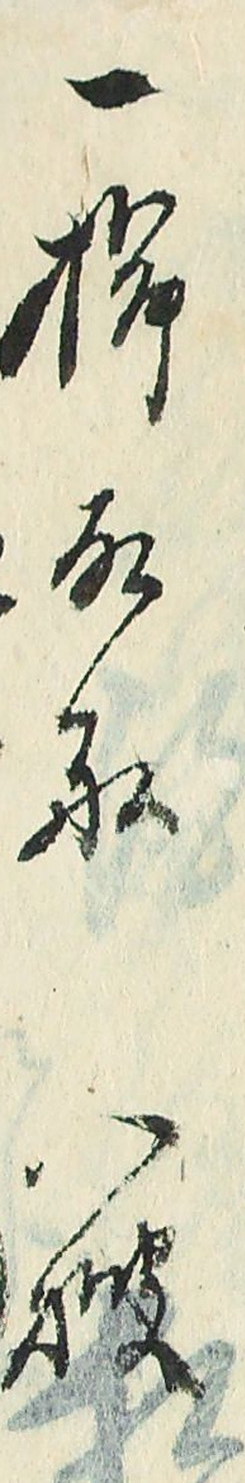一楫取船八艘
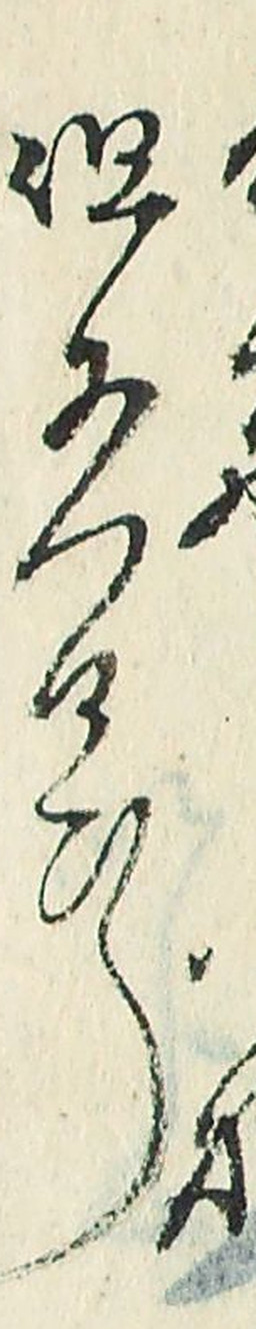但右同断

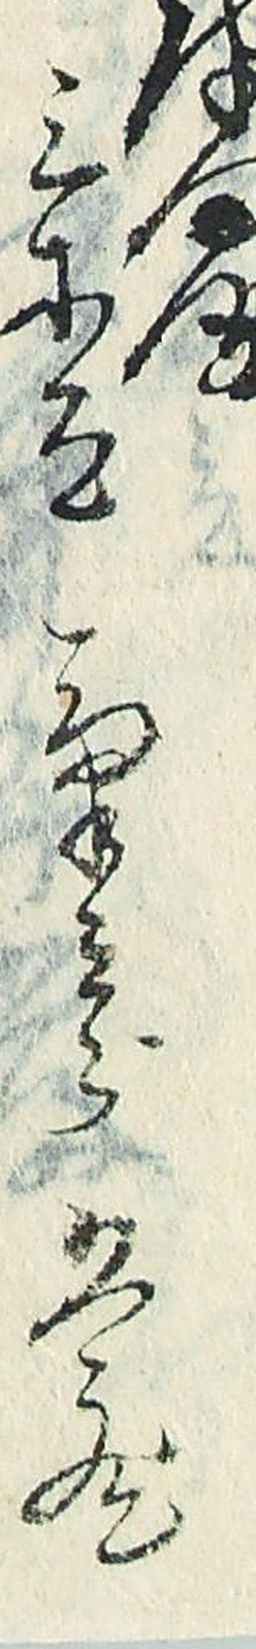三木屋気三郎久蔵
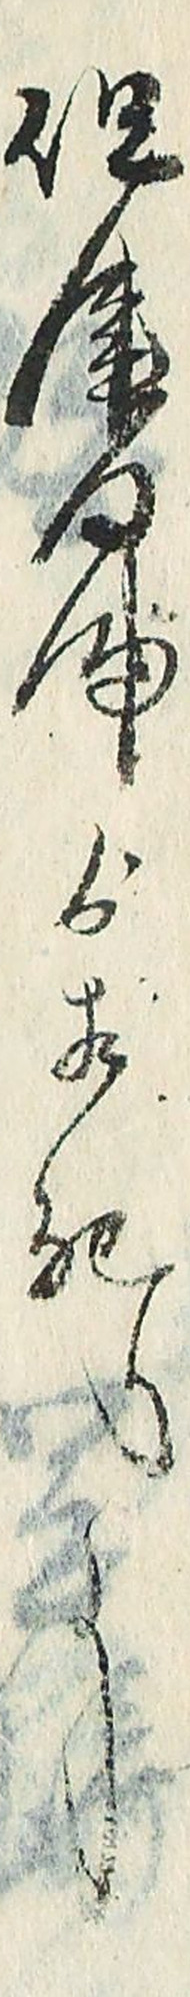但津田浦ゟ相配り候事
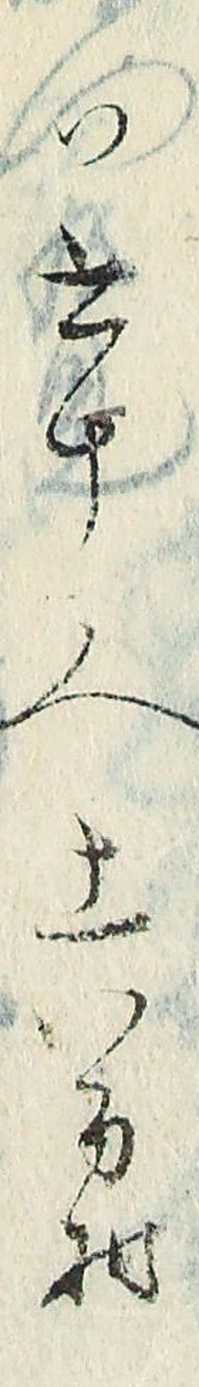同六十人上八万村
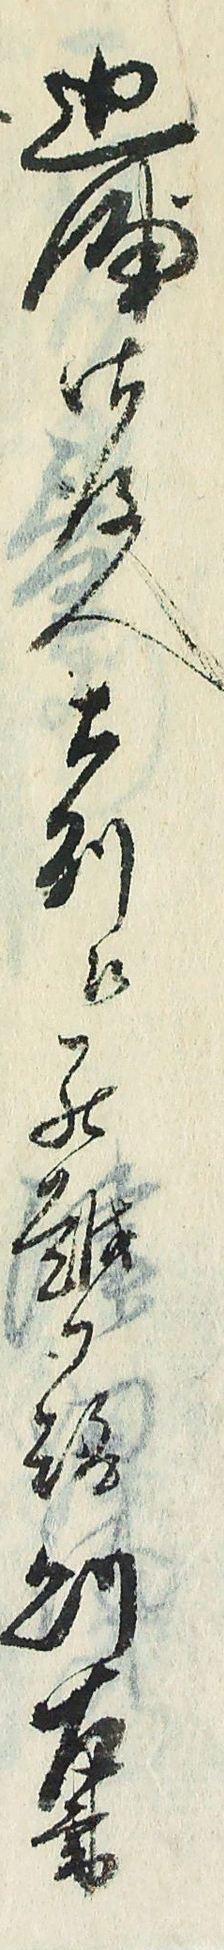廻浦御役人土州え罷越御趣則左書
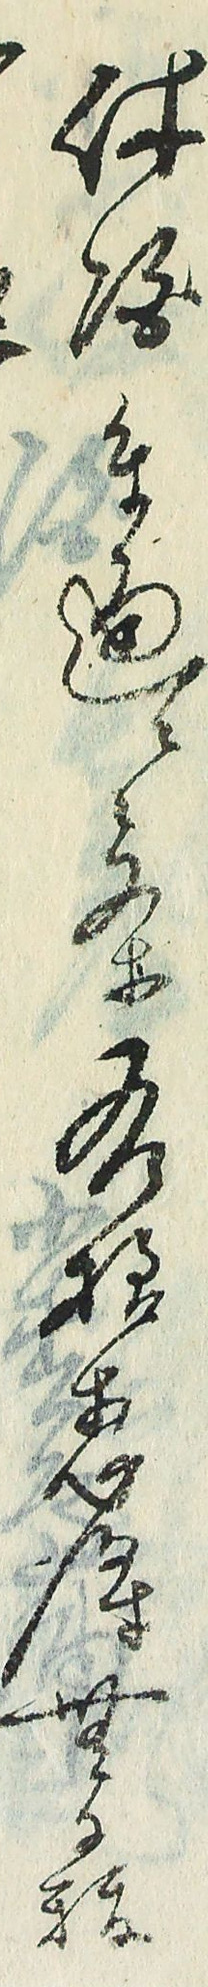休泊付通に候条右様相心得無手抜
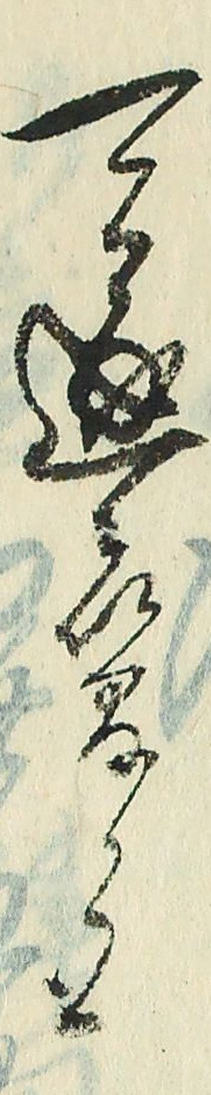可遂了簡候以上
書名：公辺御役人為御廻浦御立越諸御用一巻
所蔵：鳴門教育大学 Naruto University of Education
